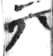亓（其）
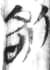咎
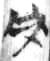凡
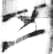五
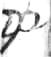卯
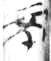不
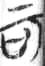可
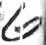㠯（以）
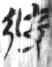{尸拃}（作）
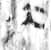大
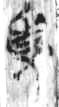事
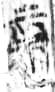帝
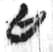㠯（以）
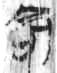命
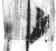嗌（益）
